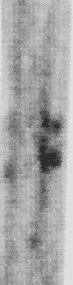身
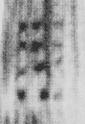必
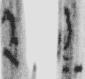從
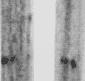之
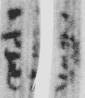言
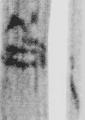及
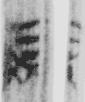鼎（則）
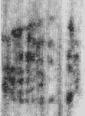明
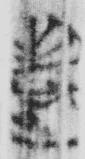○（舉）
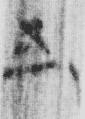之
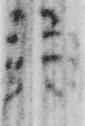而
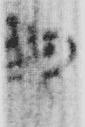母
